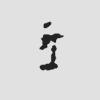皿
